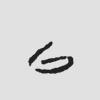㠯（以）
